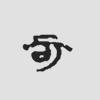可
